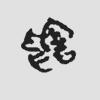婁
